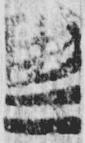則（則）
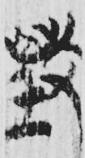毀
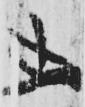之
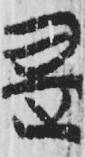是
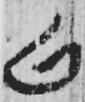㠯（以）
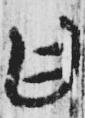曰
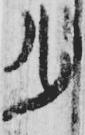少（小）
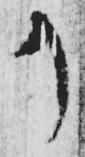人
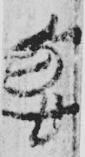惕（易）
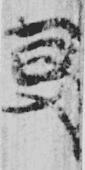○（得）
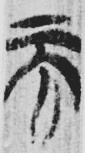而
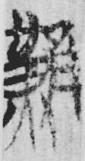難
